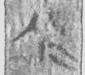八十=
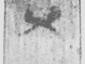五
